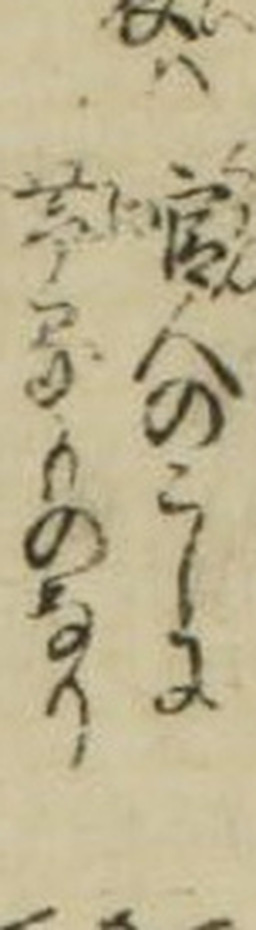帯るものなり
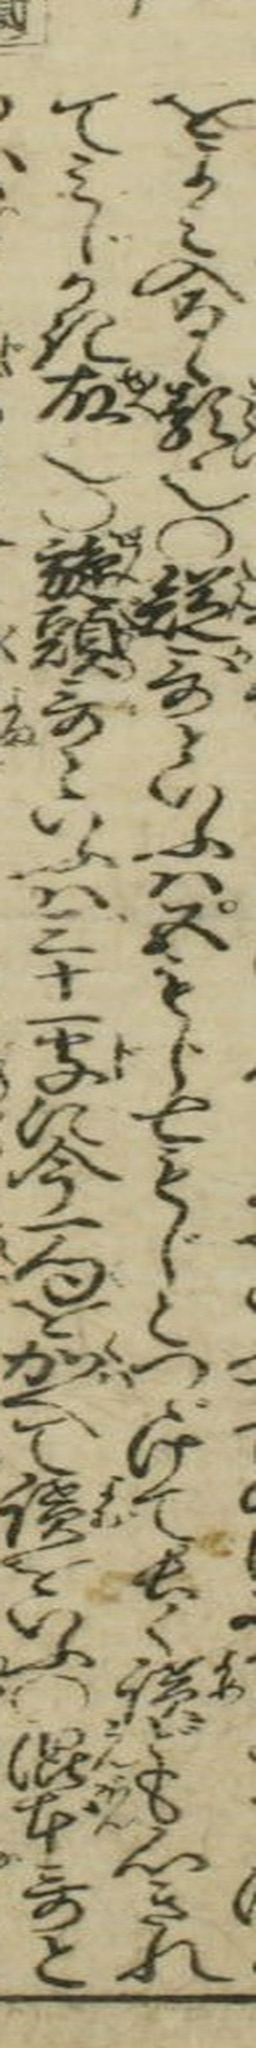てみじかき故也○旋頭哥といふは三十一字に今一句を加へて讀をいふ○混本哥と
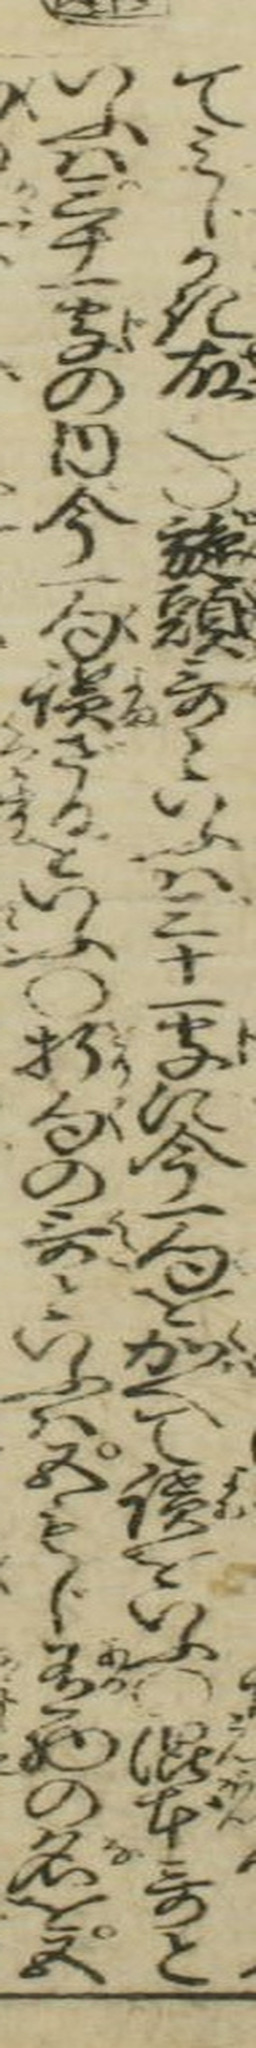いふは。三十一字の内。今一句讀ざるをいふ○折句の哥といふは。五もじ有物の名を。五
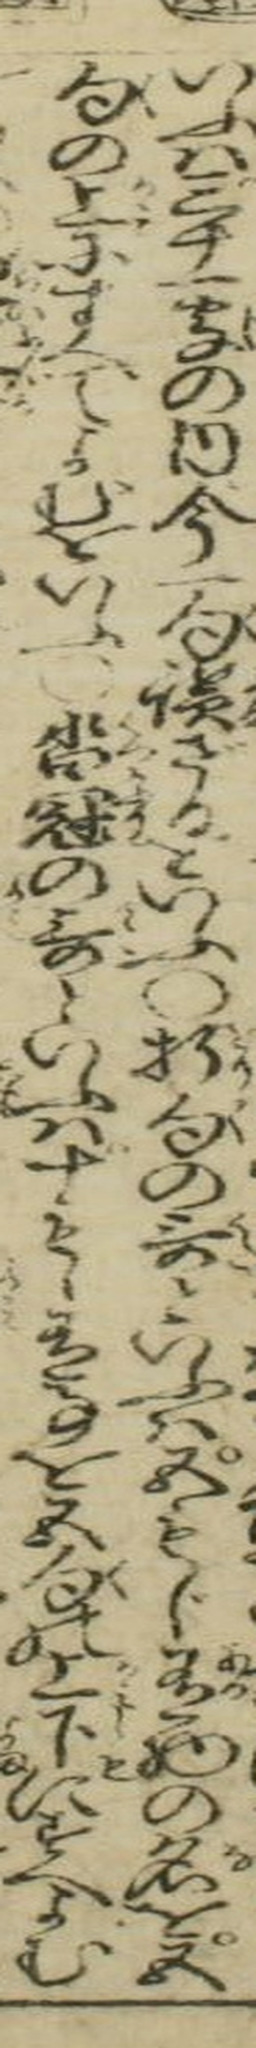句の上にすへてよむをいふ○沓冠の哥といふは。十もじ有事を五句の上下にすへよむ
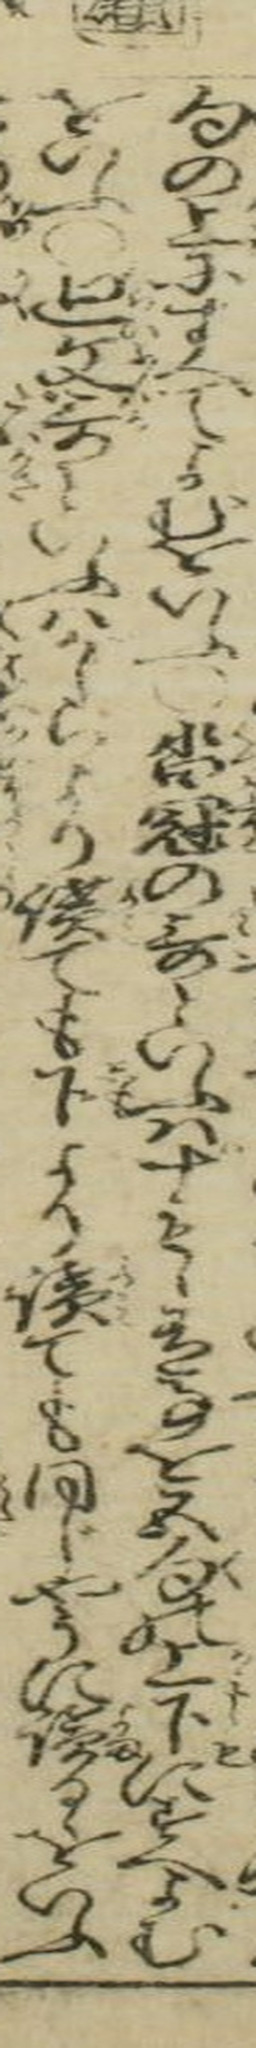をいふ○廻文哥といふは。かしらより讀ても下より讀ても同じやうに讀るゝをいふ
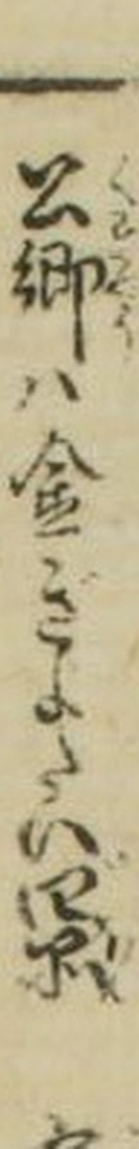公卿は金ぎよたい。四品
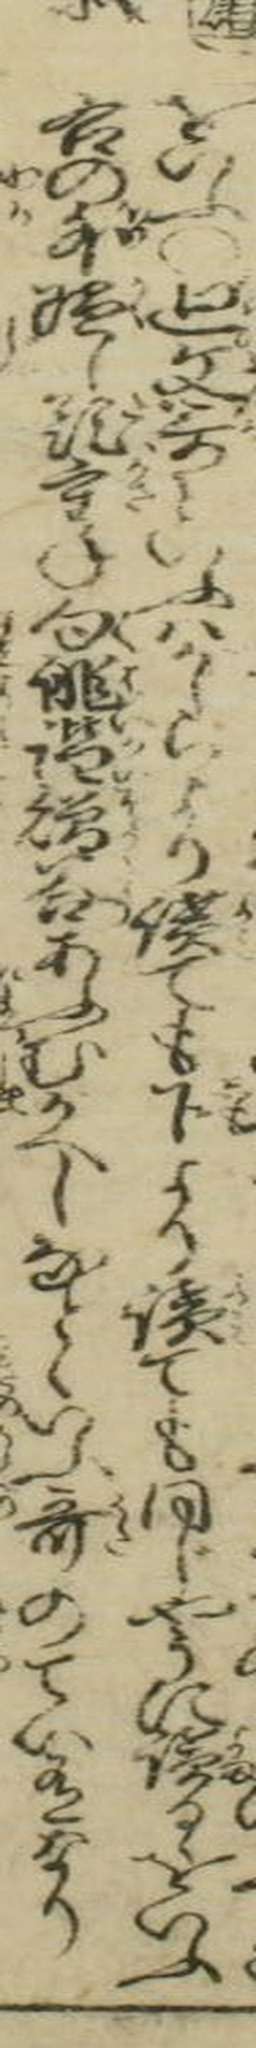右の外隠し題重ね句俳諧贈答あふむかへしなとゝいふ哥のてい有なり
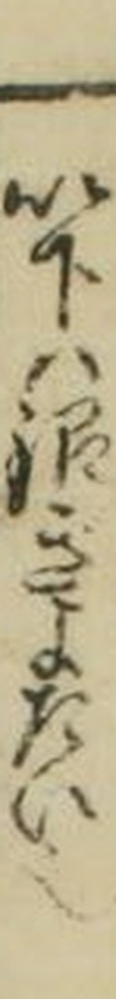以下は銀ぎよたい也終
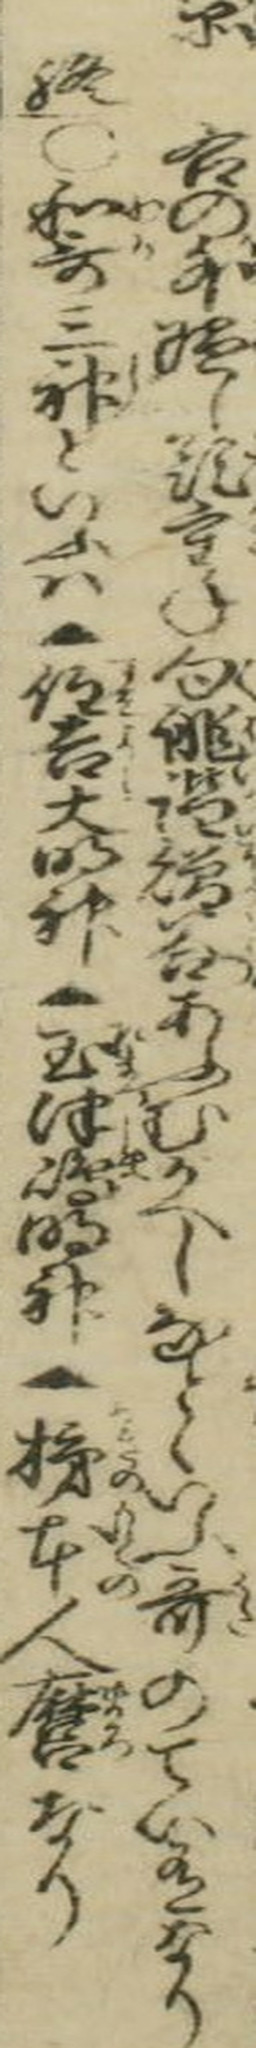○和歌三神といふは▲住吉大明神▲玉津嶋明神▲柿本人麿なり
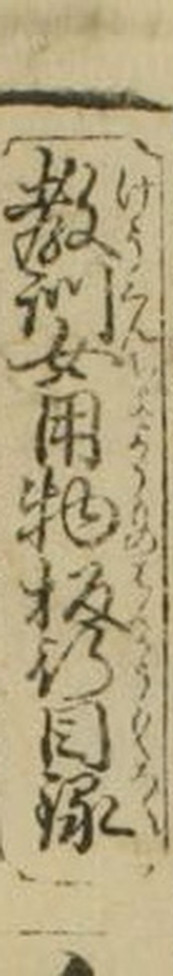教訓女用物板行目録
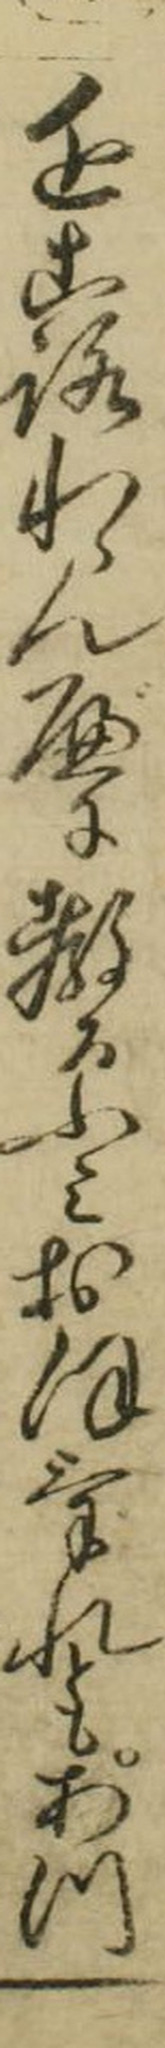近ころわらんべに教るふみおほけれとも。あつ
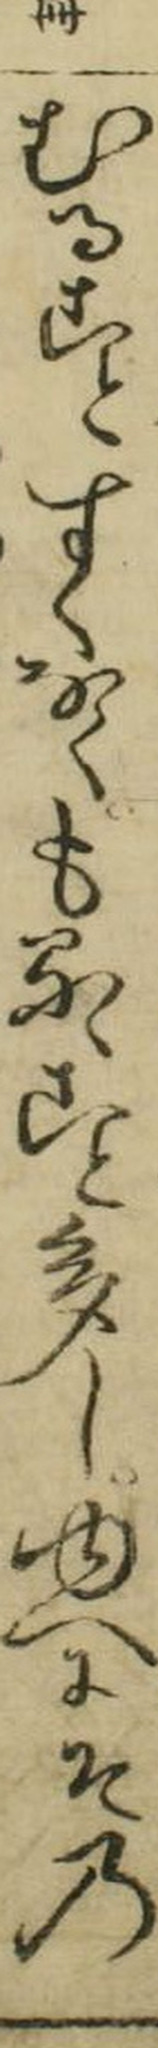むることすくなく。もるゝこと多し。ゆへにその
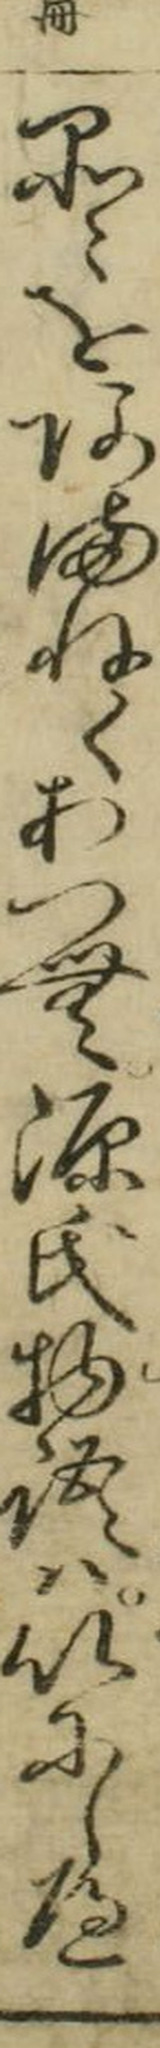品〻をあまねくあつむ。源氏物語は。いにしへ
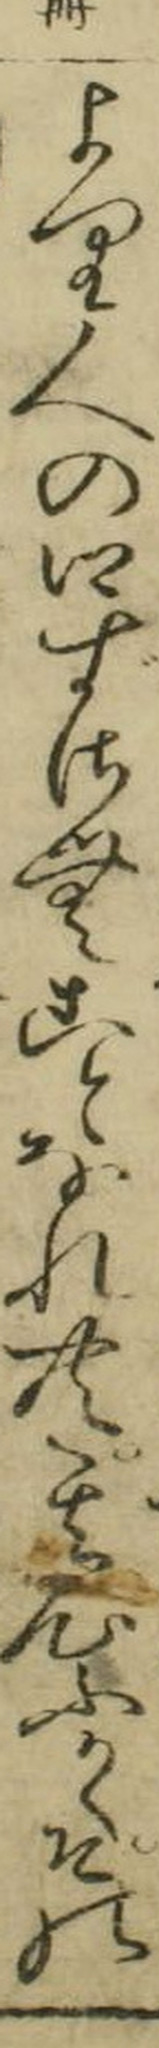より人の口ずさむことなれ共。其心ふかく。その
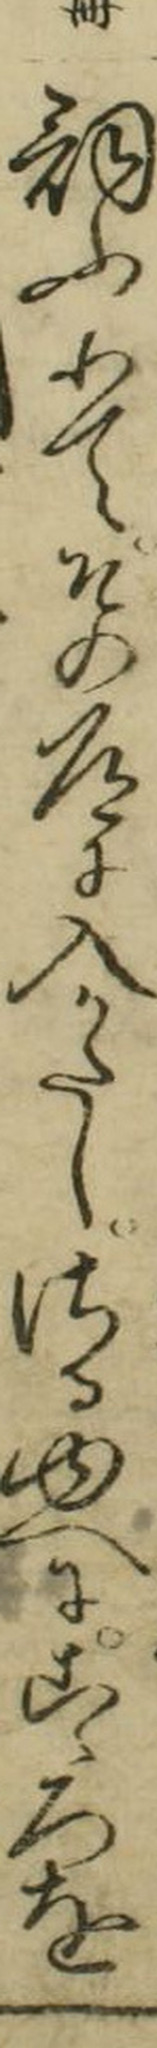詞ふりて。その道に入かたし。さるゆへに。こゝろを
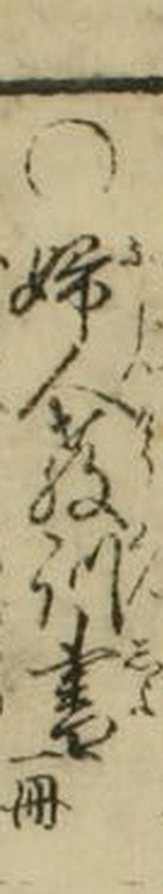○婦人教訓書一冊
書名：女源氏教訓鑑
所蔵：東京学芸大学附属図書館
